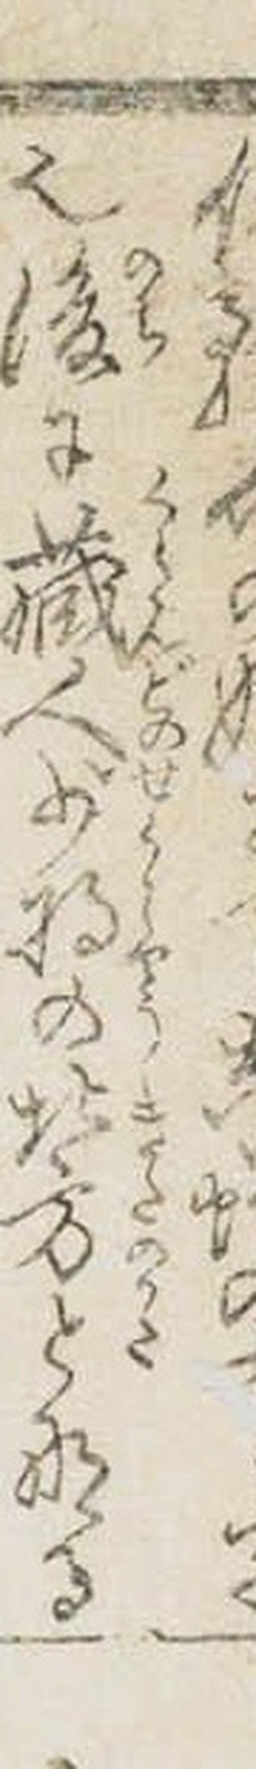也後に蔵人少将の北方となる
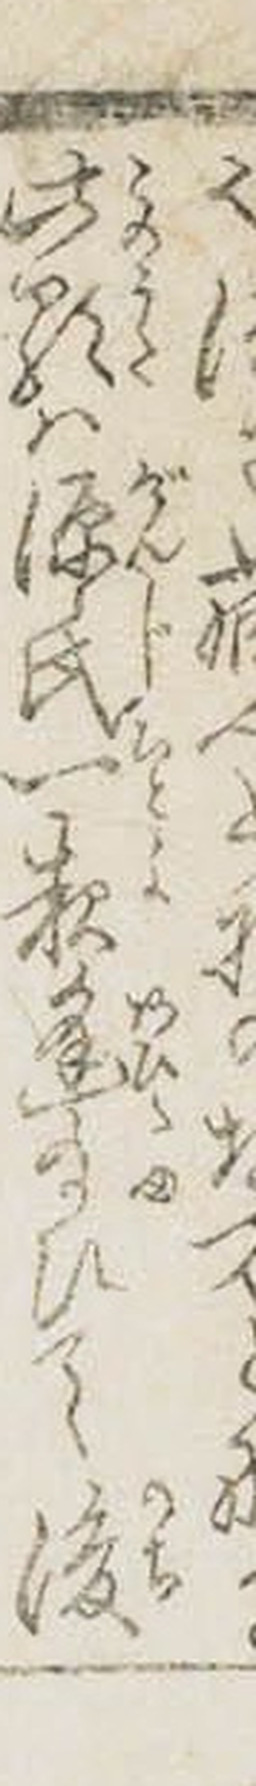此歌は源氏一夜逢給ひて後
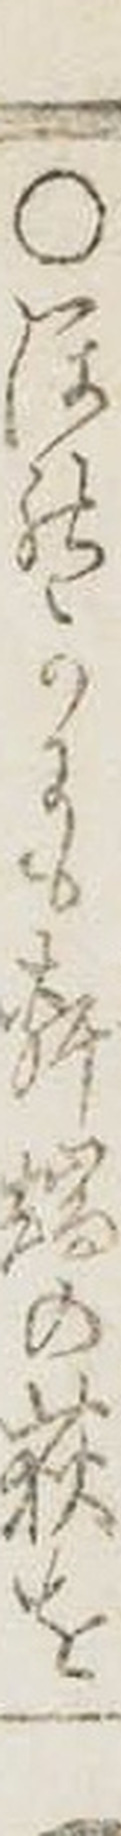○ほのかにも軒端の荻を
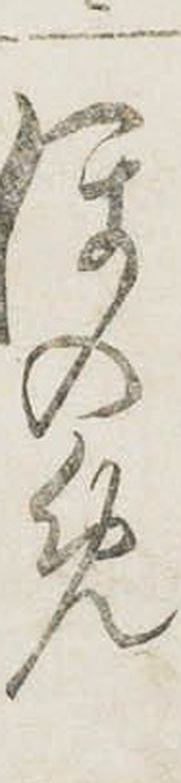ほのめ
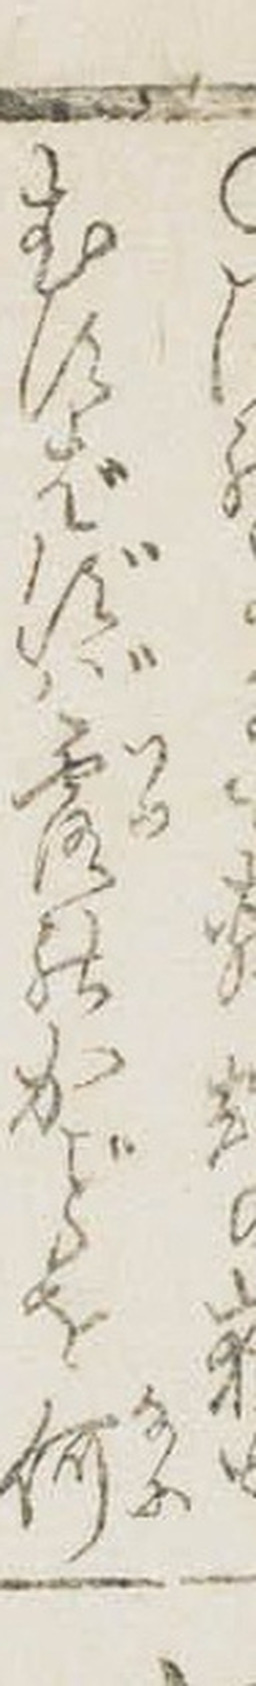むすばずば露のかごとを何
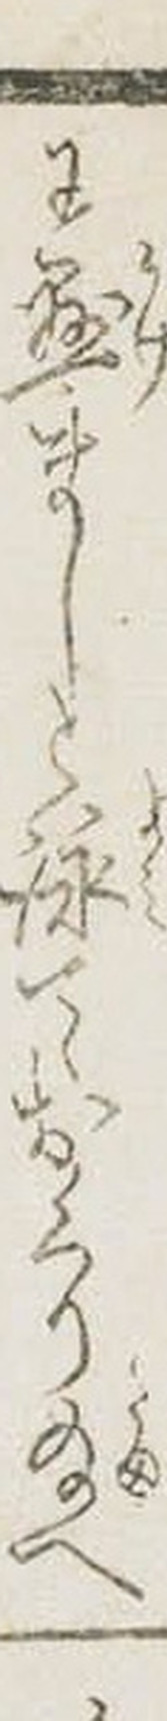に懸ましと詠ておくり給へ
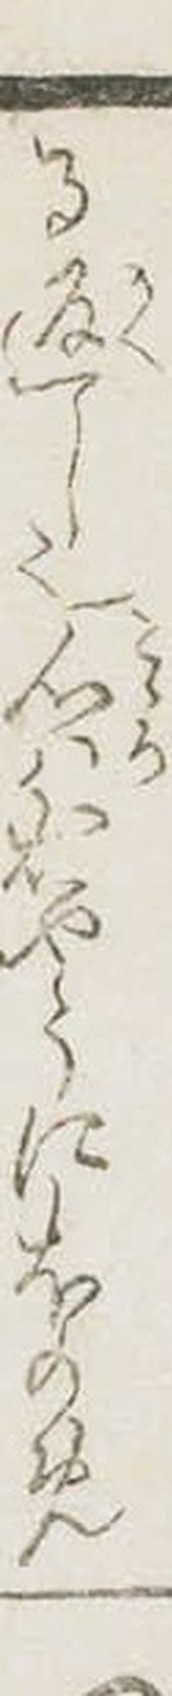る返し也心はかやうにほのめ
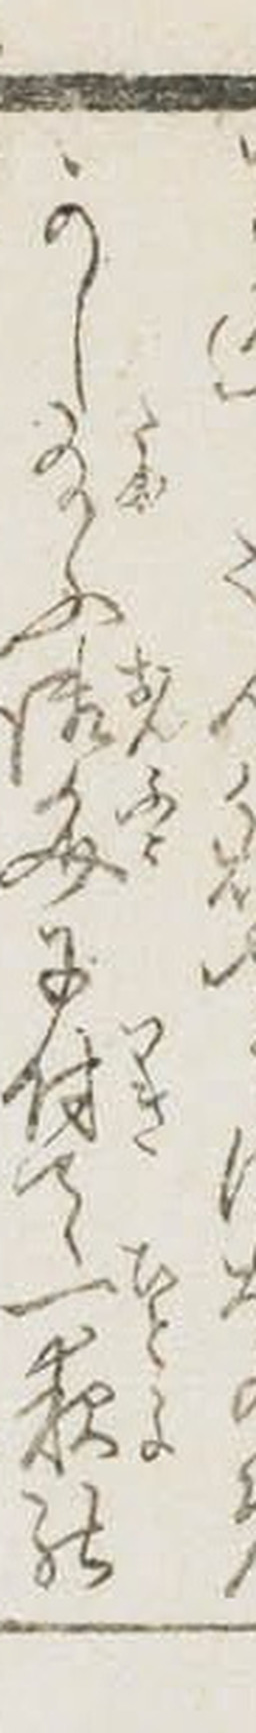かし給ふ御文に付て一夜の
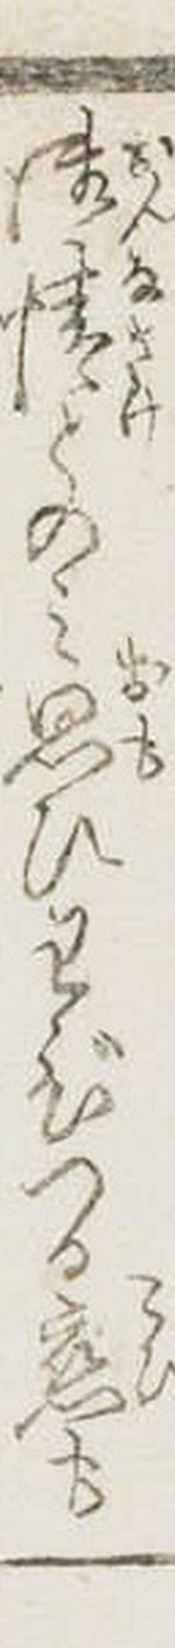御情とのみ思ひわびつる恋も
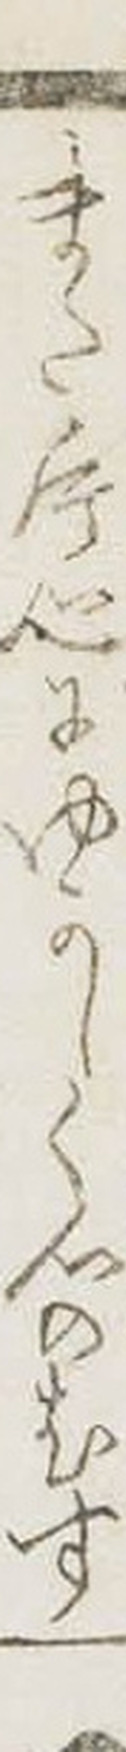また片心にゆかしく心のむす
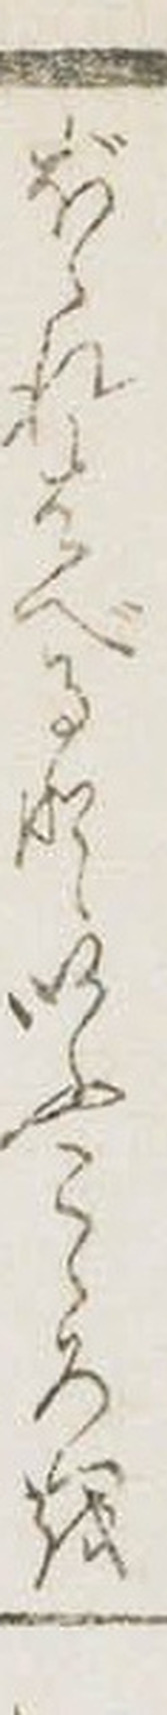ぼゝれはべるといふこゝろを
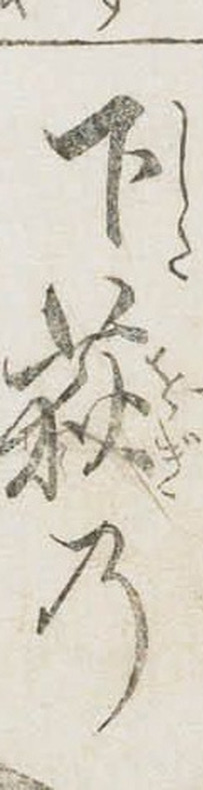下荻の
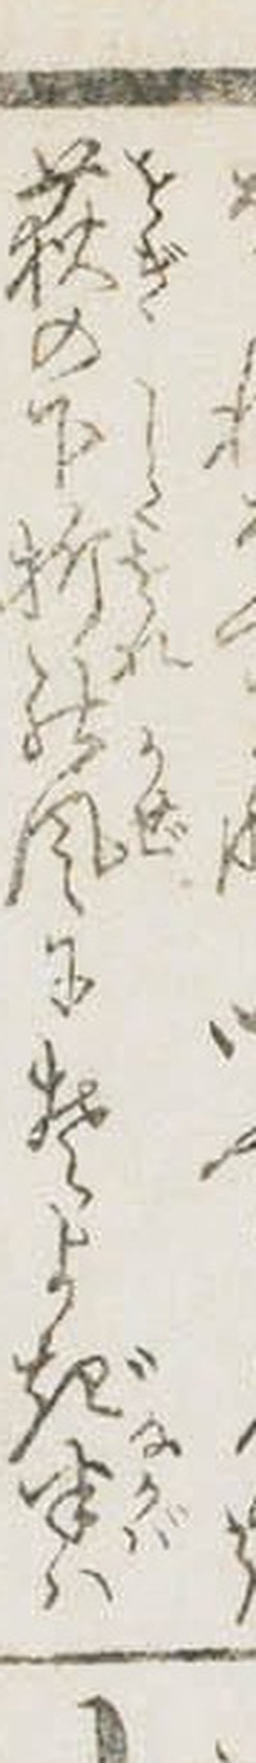荻の下折の風にそよぎ半は
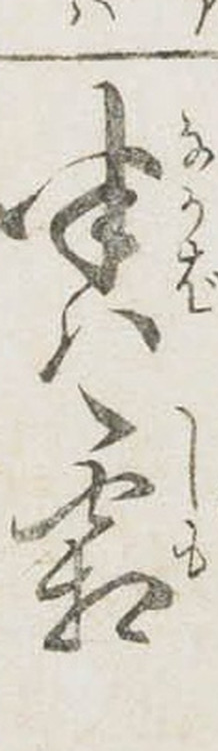半は霜
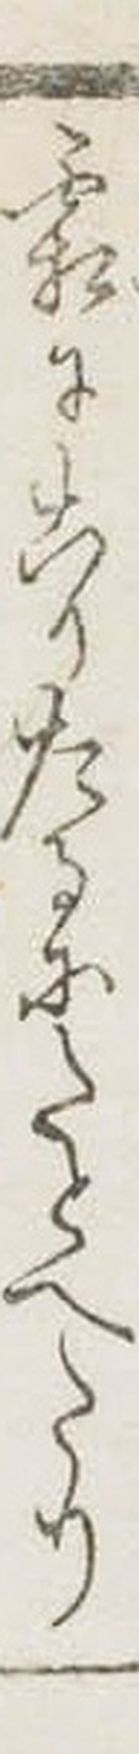霜にこりたるにたとへたり
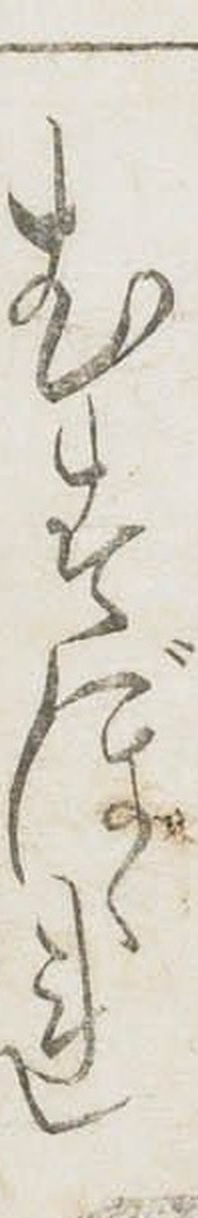むすぼゝれ
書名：源氏百人一首
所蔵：東京学芸大学教育コンテンツアーカイブ
